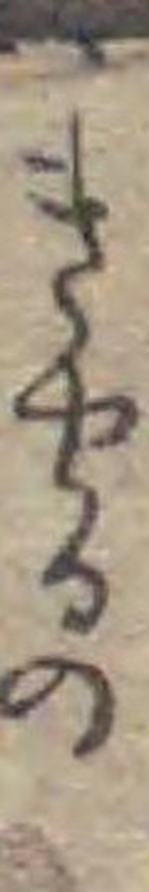きせるの
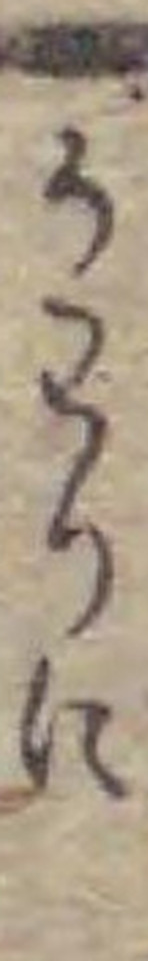かわりに
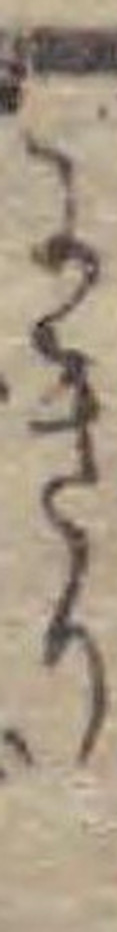にきり
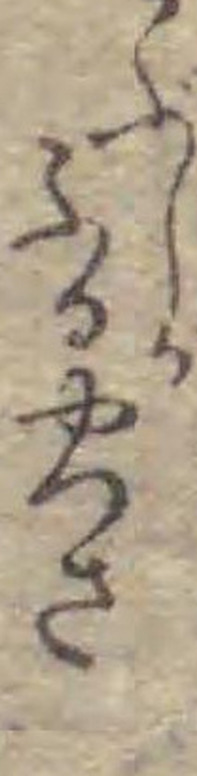ふるやつさ
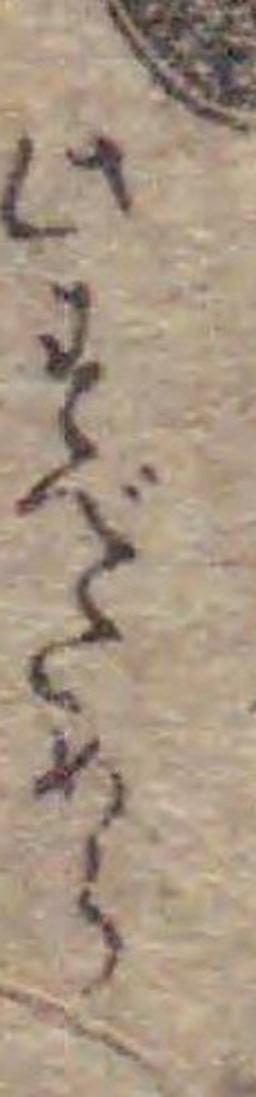此すべためら
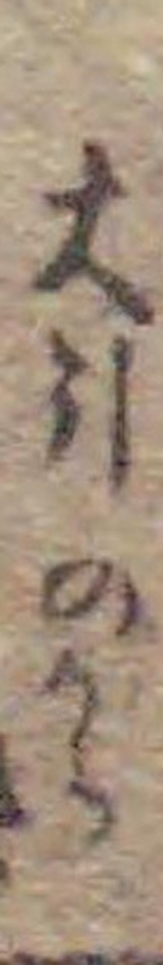大引のから
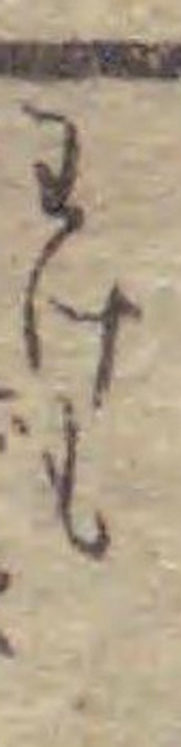わけも
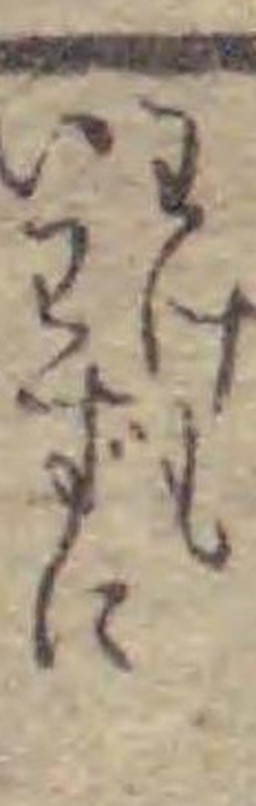いわずに

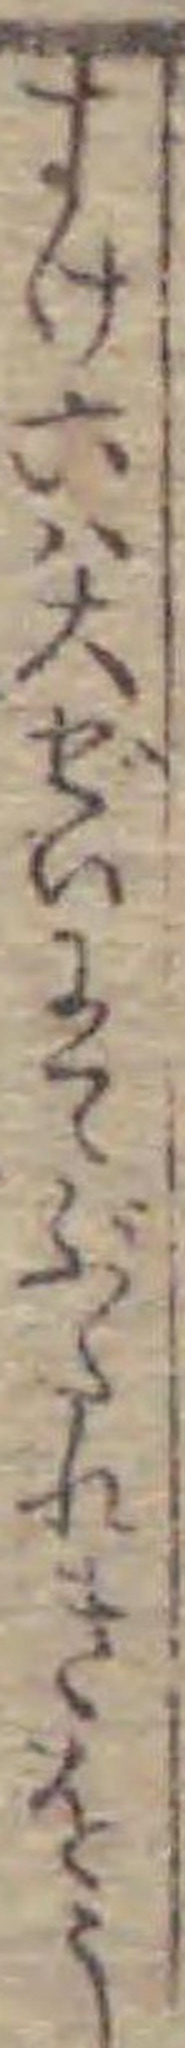すけ六はおおぜいにてぶたれきをうし
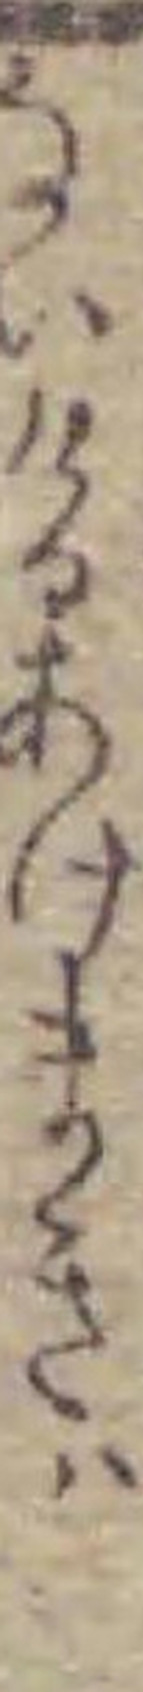ないけるあけまきは
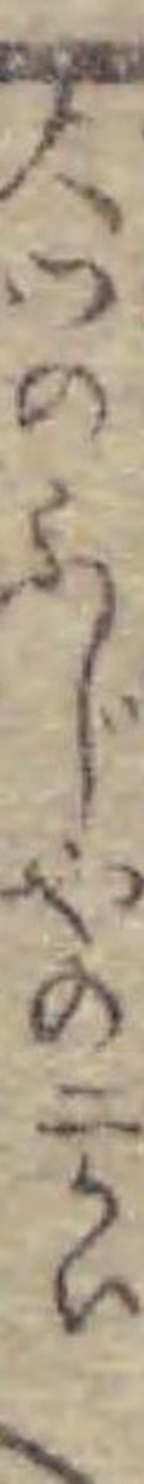大門のふじやの二かい
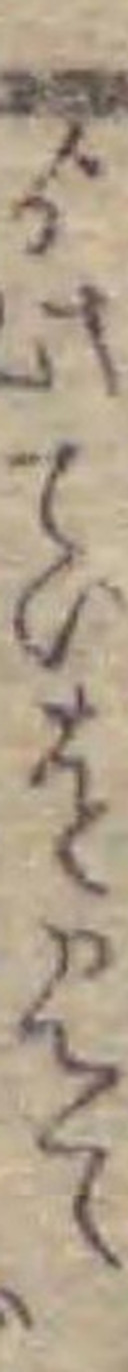より此ていを見て
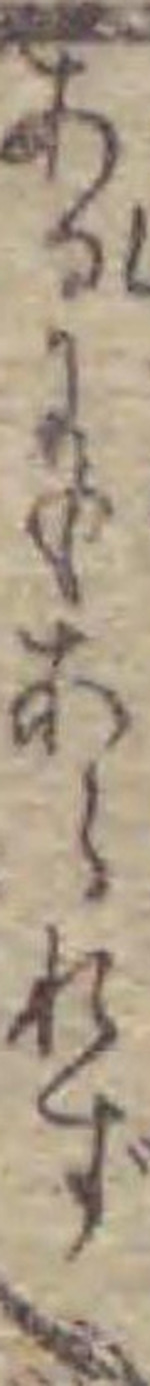あるにもあられず
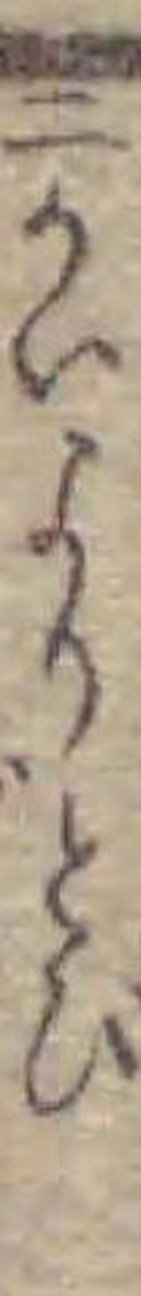二かいよりとび
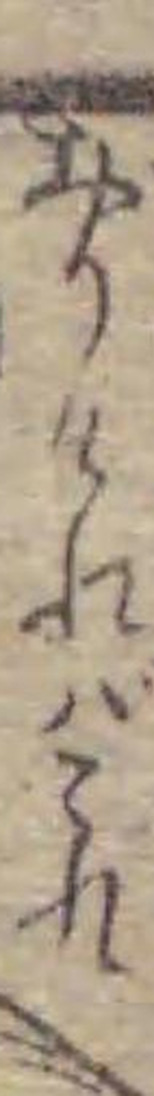おりければこれ
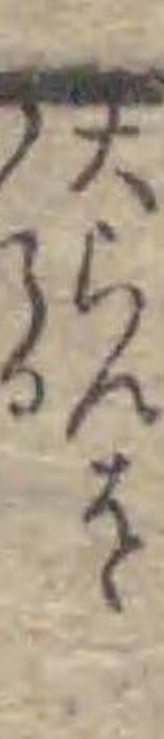大らんを
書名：江戸花俳優贔屓 : 3巻
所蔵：国立国会図書館 National Diet Library, JAPAN
